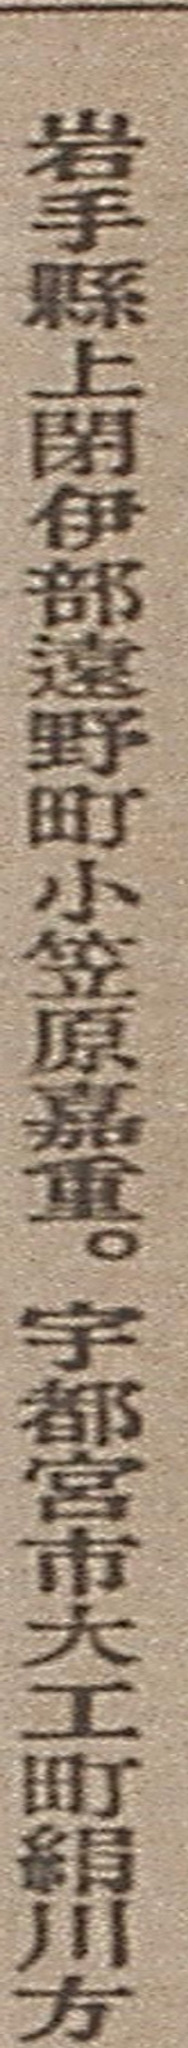岩手県上閉伊部遠野町小笠原嘉重。宇都宮市大工町絹川方土
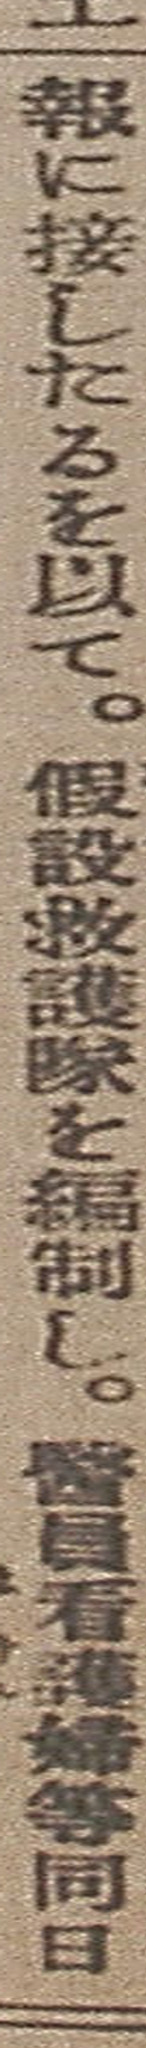報に接したるを以て。仮設救護隊を編制し。医員看護婦等同日
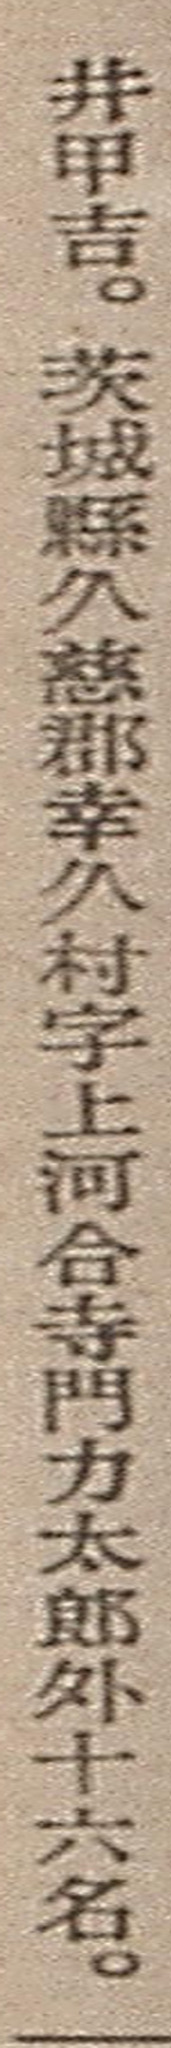井甲吉。茨城県久慈郡幸久村字上河合寺門力太郎外十六名。
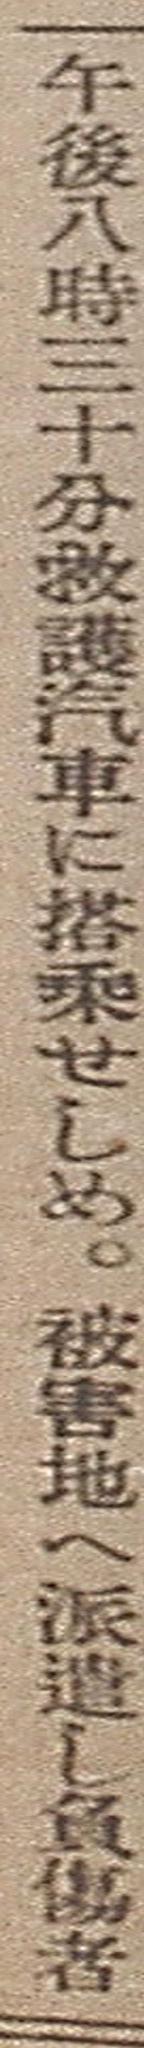午後八時三十分救護汽車に搭乗せしめ。被害地へ派遣し負傷者

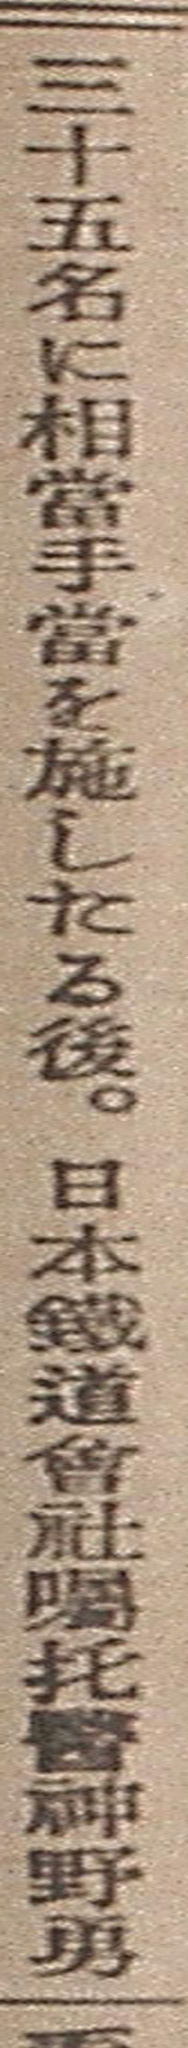三十五名に相当手当を施したる後。日本鉄道会社嘱託医神野勇
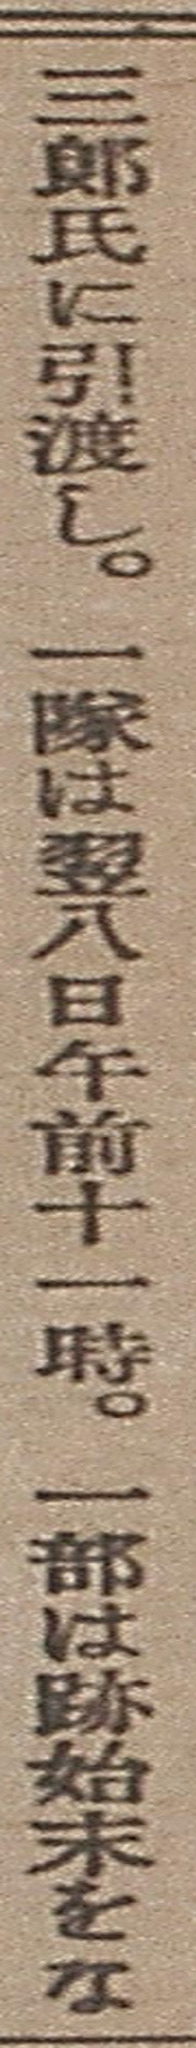三郎氏に引渡し。一隊は翌八日午前十一時。一部は跡始末をな
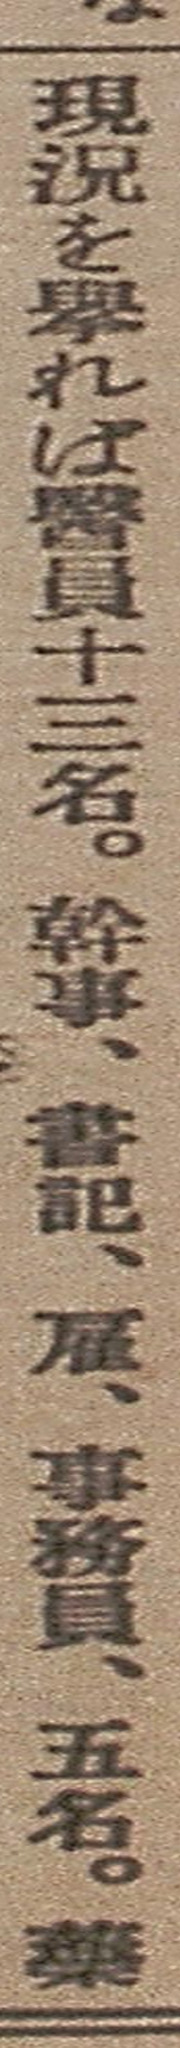現況を挙れば医員十三名。幹事、書記、雇、事務員、五名。薬
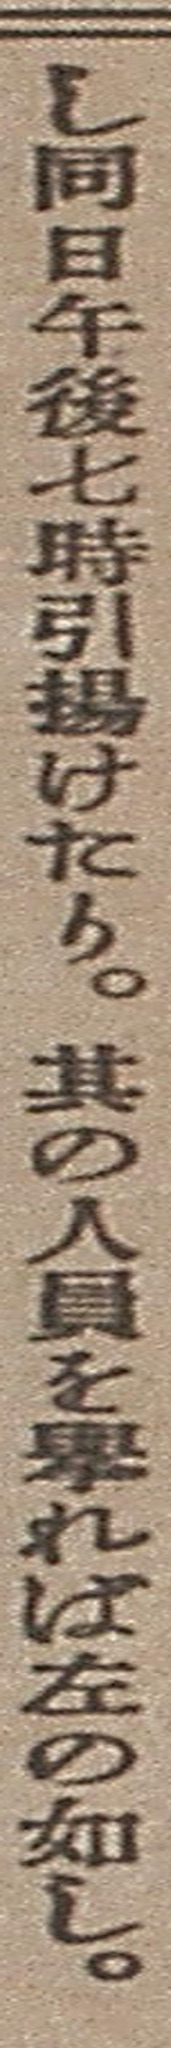し同日午後七時引揚けたり。其の人員を挙れば左の如し。
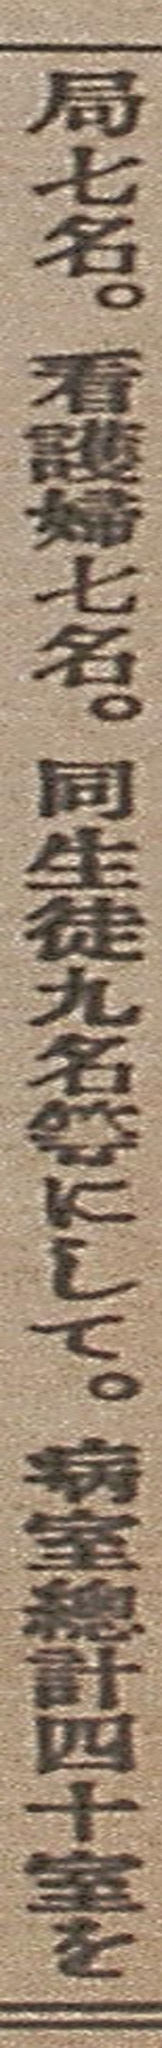局七名。看護婦七名。同生徒九名等にして。病室総計四十室を
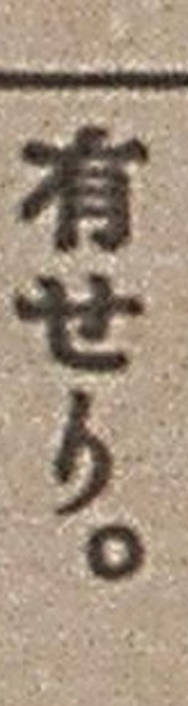有せり。
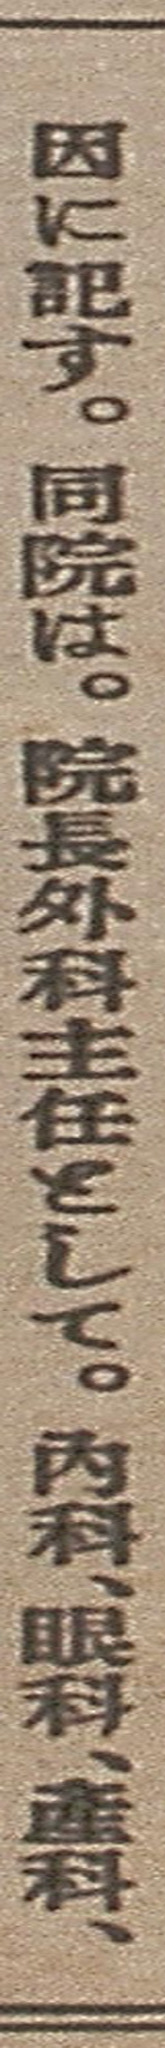因に記す。同院は。院長外科主任として。内科、眼科、産科、
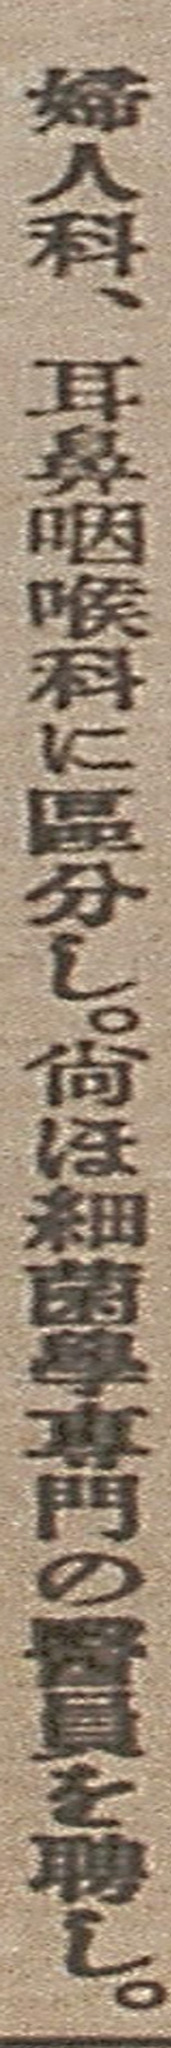婦人科、耳鼻咽喉科に区分し。尚ほ細菌学専門の医員を聘し。
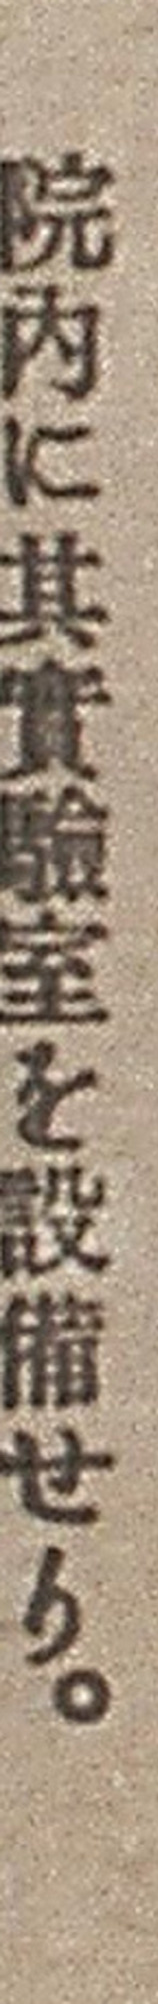院内に其実験室を設備せり。
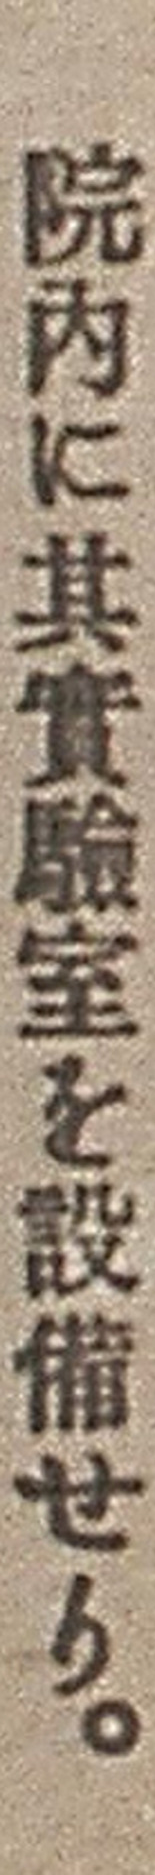院内に其実験室を設備せり。
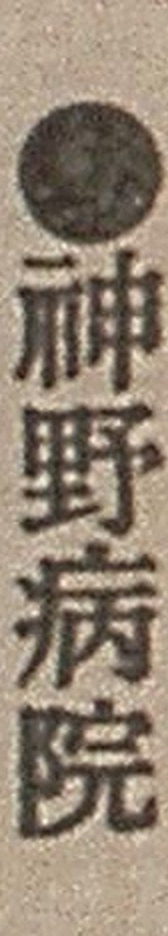●神野病院
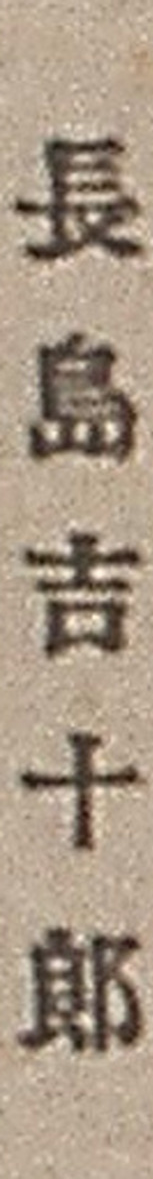長島吉十郎
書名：風俗畫報臨時増刊第百九十九號　明治三十二年十月各地災害圖會（前編之續）
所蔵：東京大学地震研究所図書室 Earthquake Research Institute Library, The University of Tokyo, JAPAN
